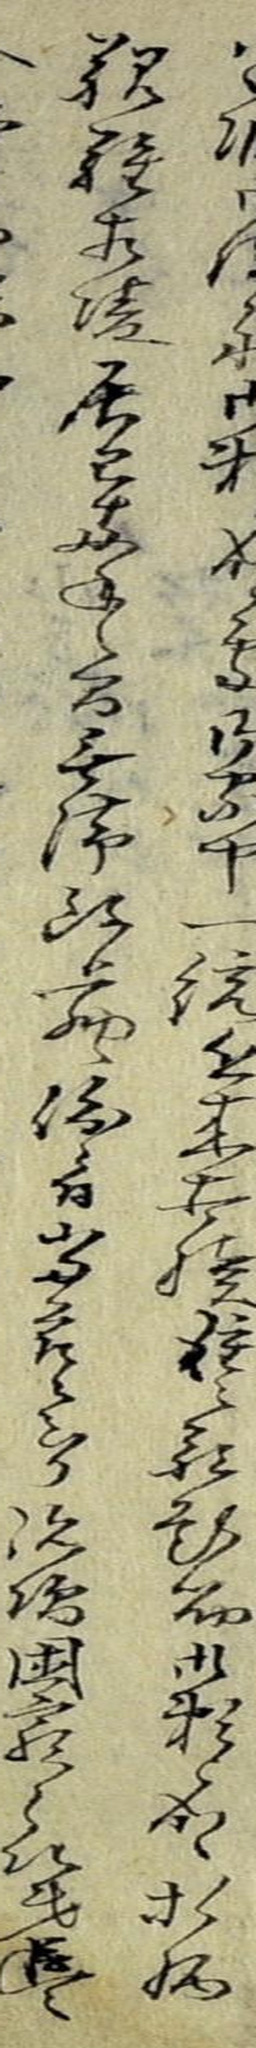艱難相凌辰巳両年之間無滞致上納候儀に付当節に至り弥増困窮之次第追々
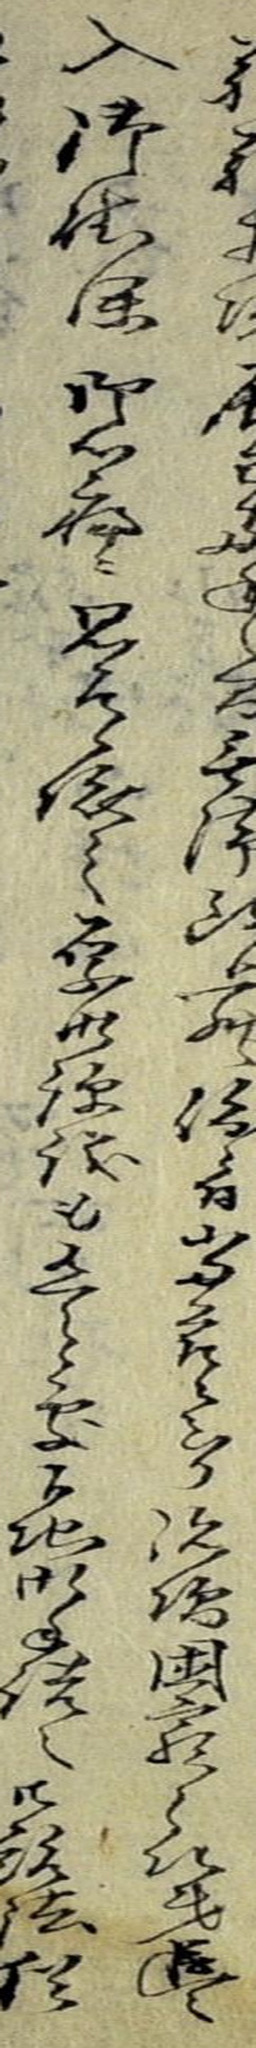入御聴深御心痛被思召候依之厚御評議も有之候処下地御手詰之御趣法猶
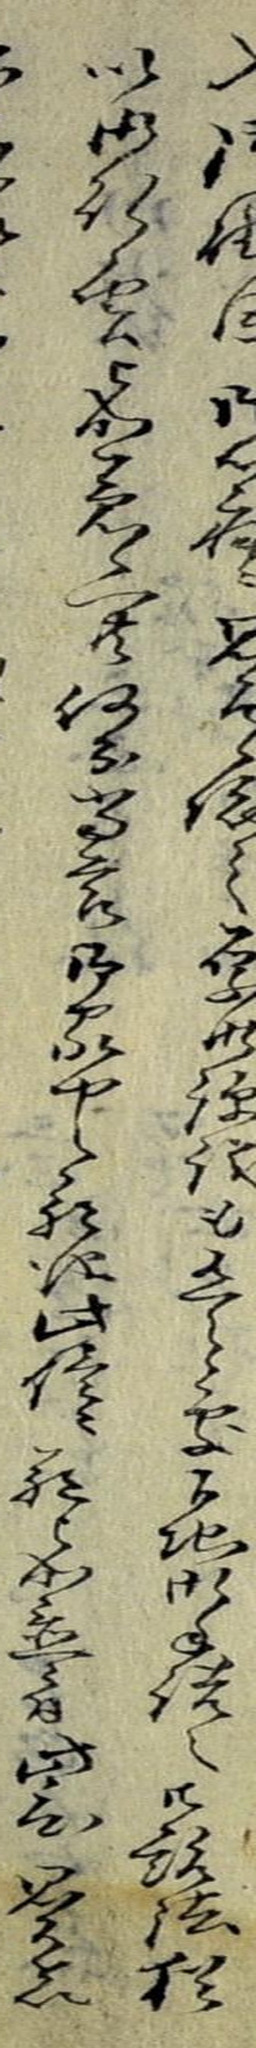以御行届は被成兼候へ共何分当節御家中之難儀此侭に難被成置に付此度思召を以
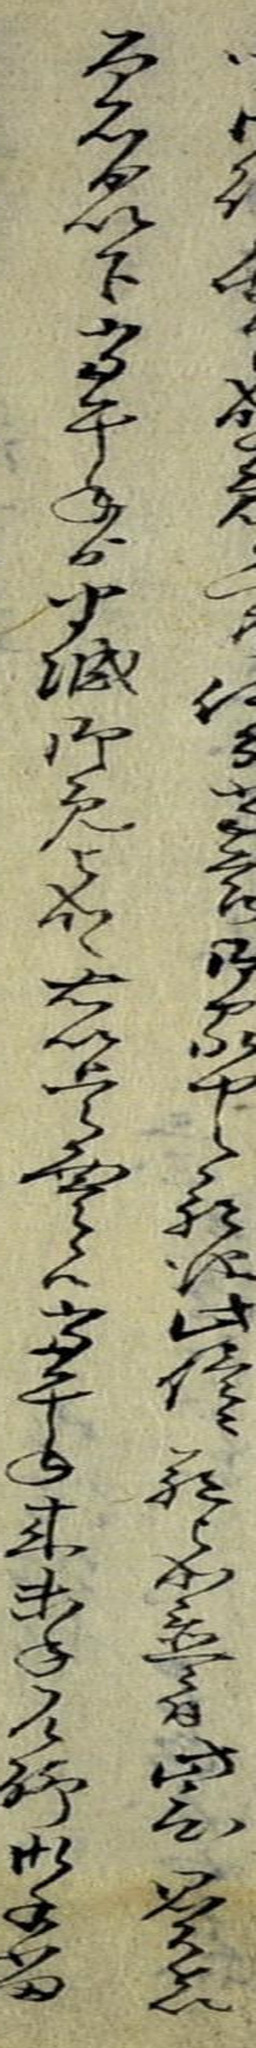百石ゟ以可当午年ゟ半減御免被成候右以上之面々は当午年來未年乍聊御手当
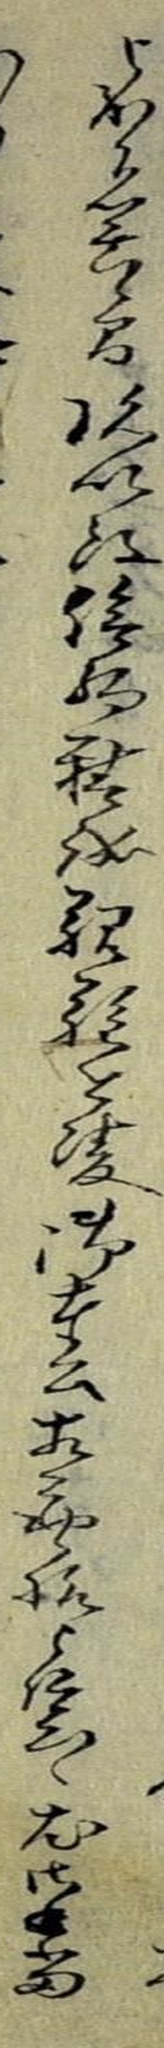被成下筈候間弥以致倹約精誠艱難を凌御奉公相勤候様被仰出候尤御手当
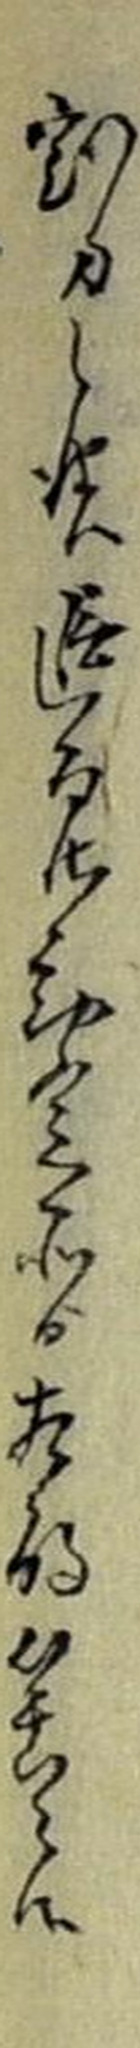割方之儀は追而御勘定所ゟ相触筈に候
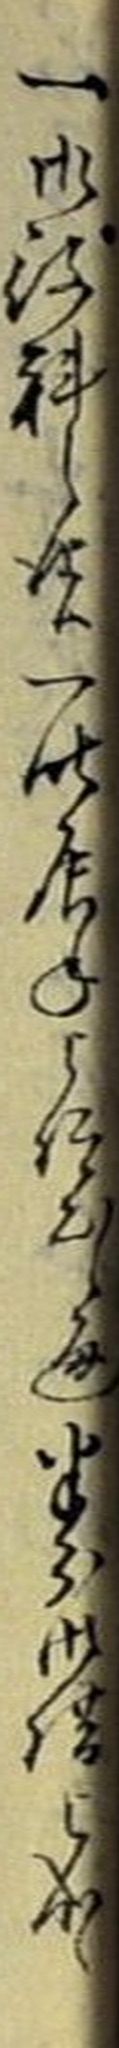一御役料之儀は一昨辰年被仰出候通半分御借被成候
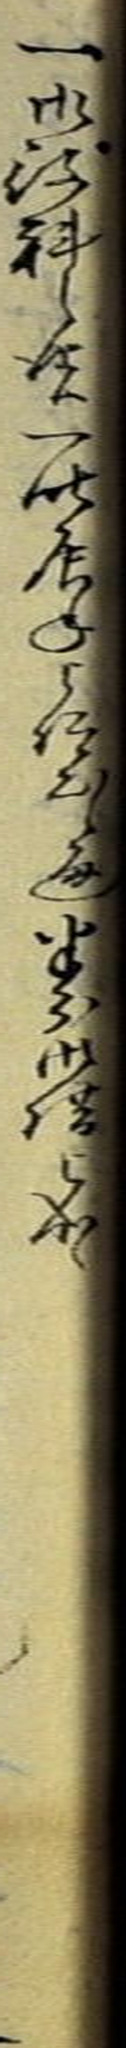一御役料之儀は一昨辰年被仰出候通半分御借被成候
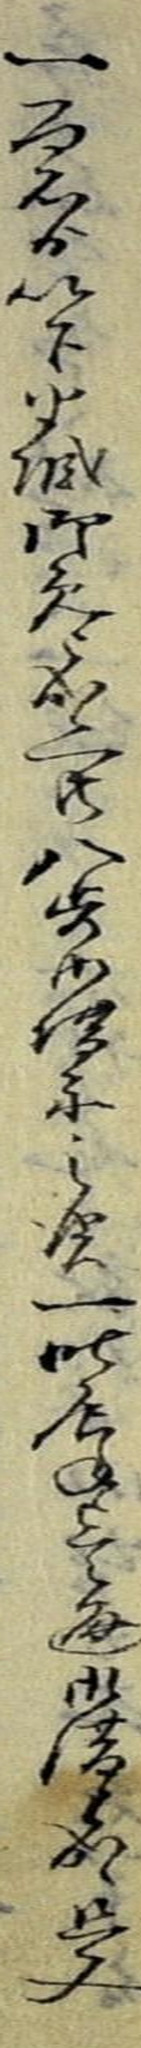一百石ゟ以可半減御免被成候へ共八分御借米之儀は一昨辰年迄之通御借被成候且又
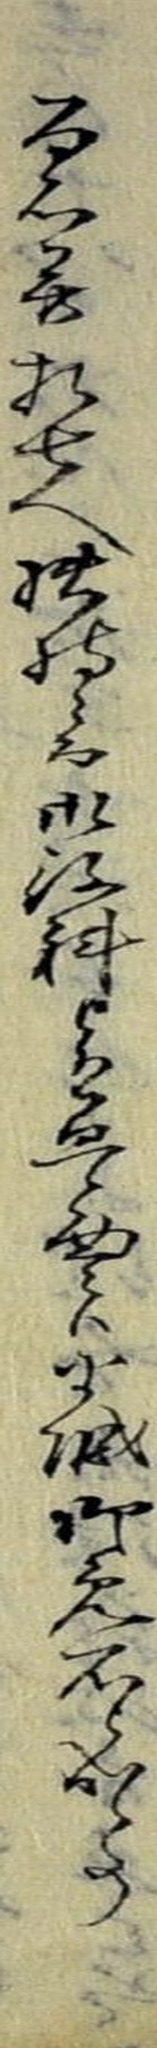百石并拾七人扶持に而御役料被下置候面々は半減御免不被成候事
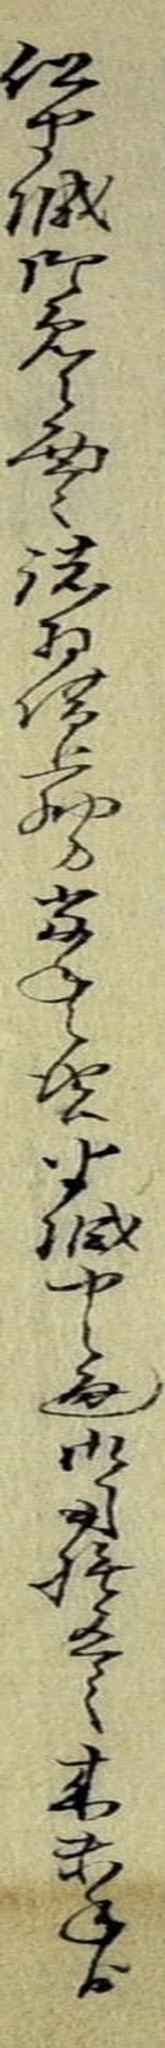但半減御免之面々諸拝借上納方当年之儀は半減中之通御用捨有之来未年ゟ
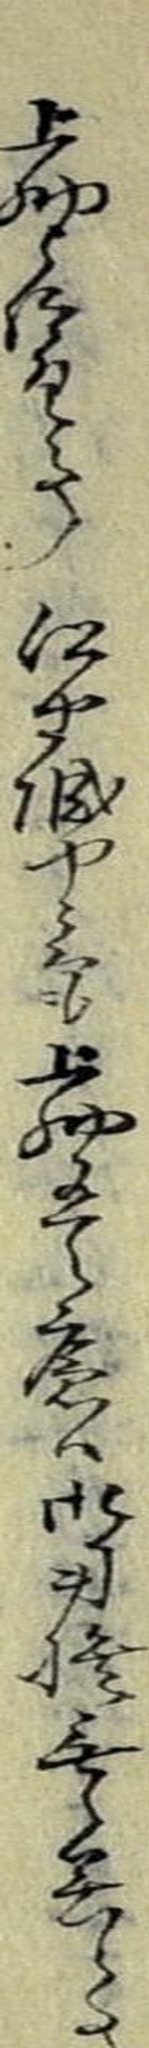上納被仰付候事但半減中に而も上納有之廉は御用捨無之筈之事
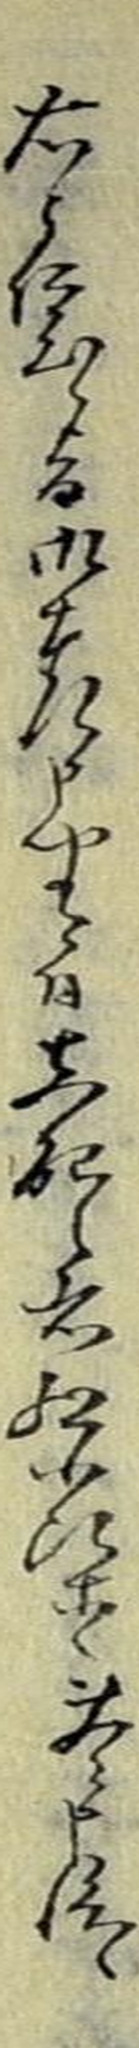右被仰出候旨御奉行申聞候に付支配之者組小頭等へ夫々申渡候
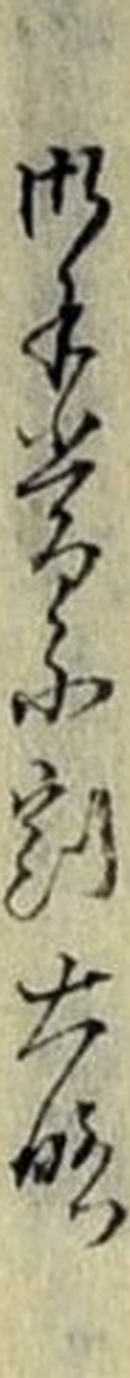御手当米割大略
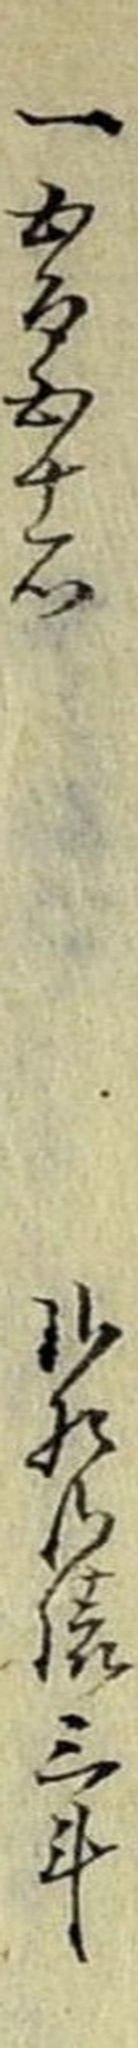一五百五十石弐拾弐俵三斗
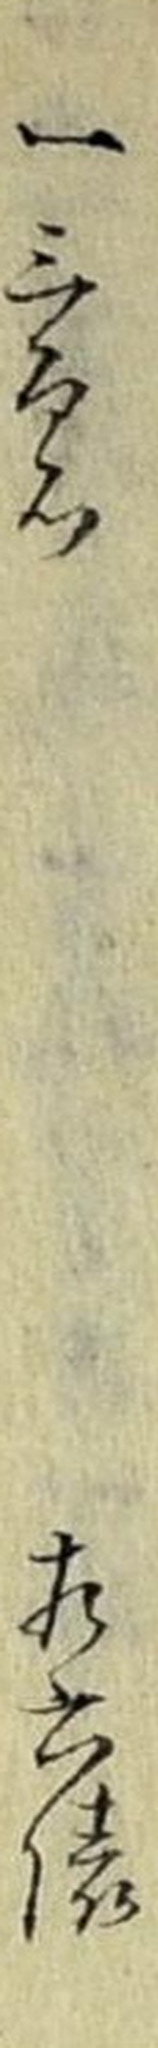一三百石拾六俵
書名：命令之部 六
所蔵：福井県文書館 Fukui Prefectural Archives
